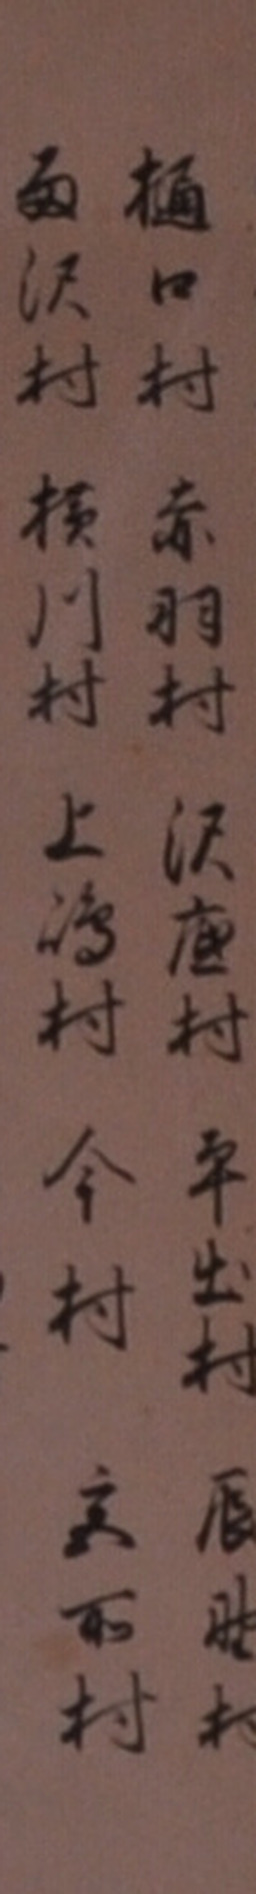雨沢村横川村上島村今村宮所村
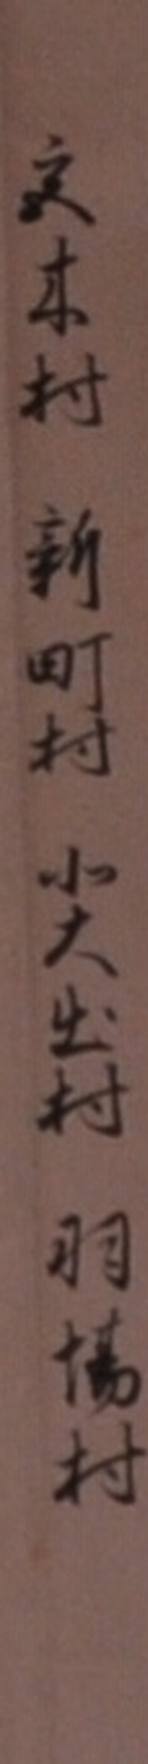宮木村新町村北大出村羽場村
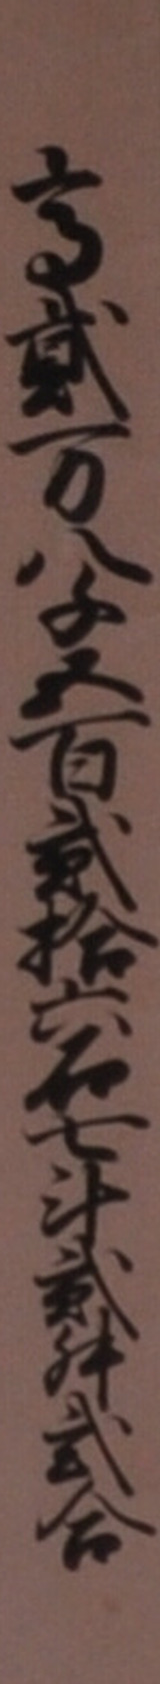高弐万八千五百弐拾六石七斗弐升弐合
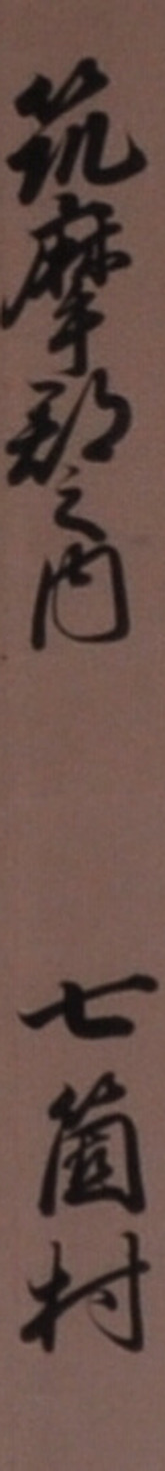筑摩郡之内七箇村
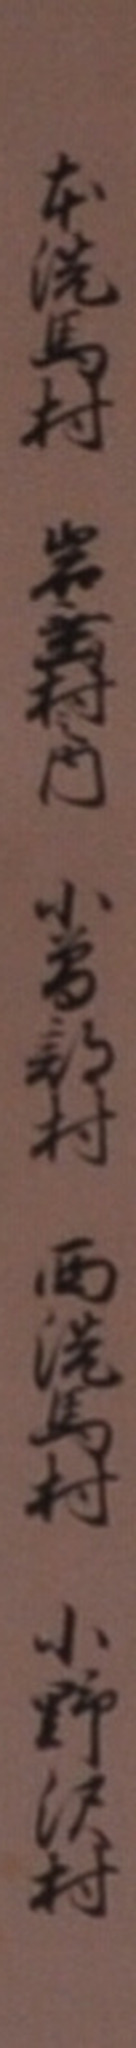本洗馬村岩垂村之内小曽部村西洗馬村小野沢村
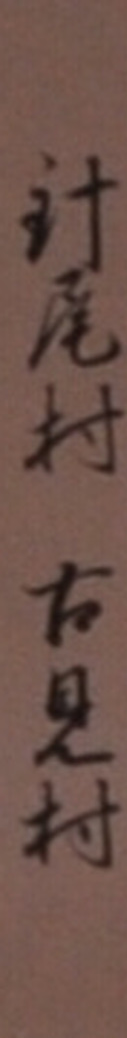針尾村古見村
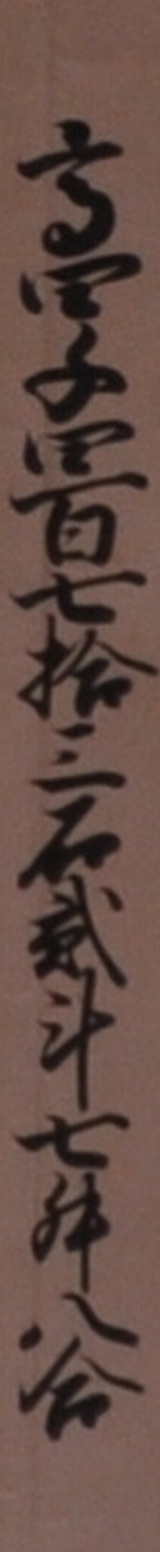高四千四百七拾三石弐斗七升八合
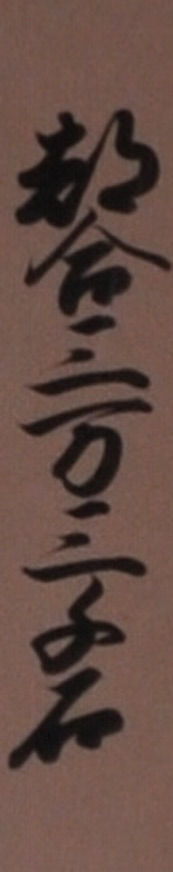都合三万三千石
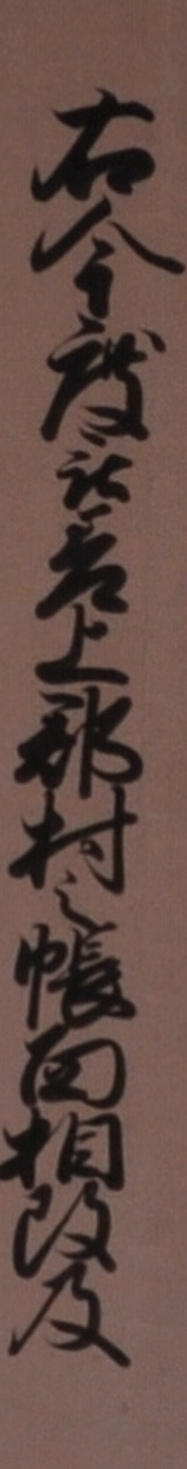右今度被差上郡村之帳面相改及
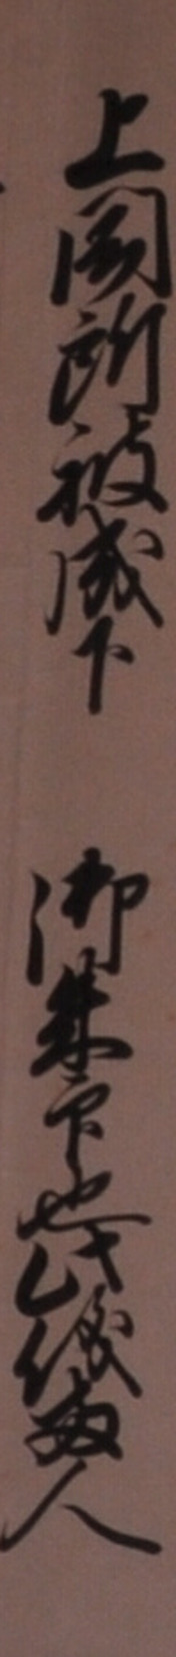上聞所被成下御朱印也此儀両人
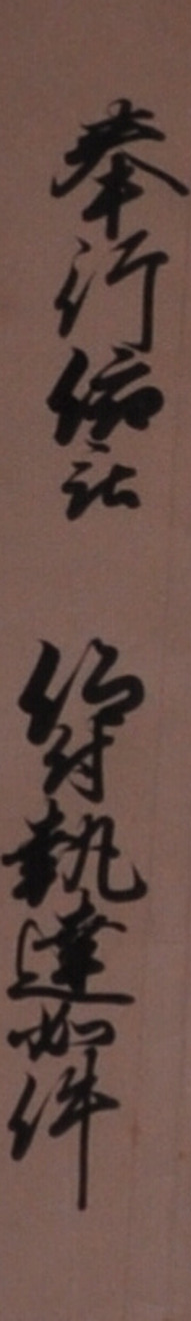奉行依被仰付執達如件
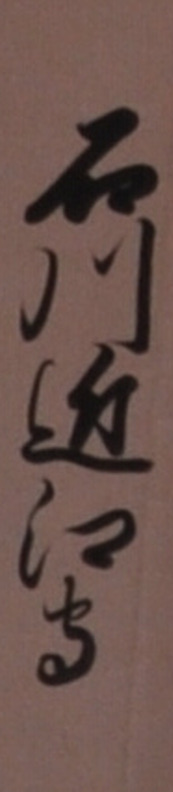石川近江守
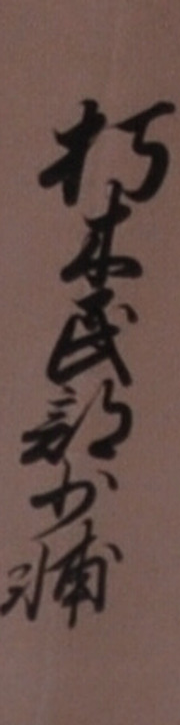朽木民部少輔
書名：御朱印写・領地目録
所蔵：伊那市立高遠町図書館・合同会社AMANE
